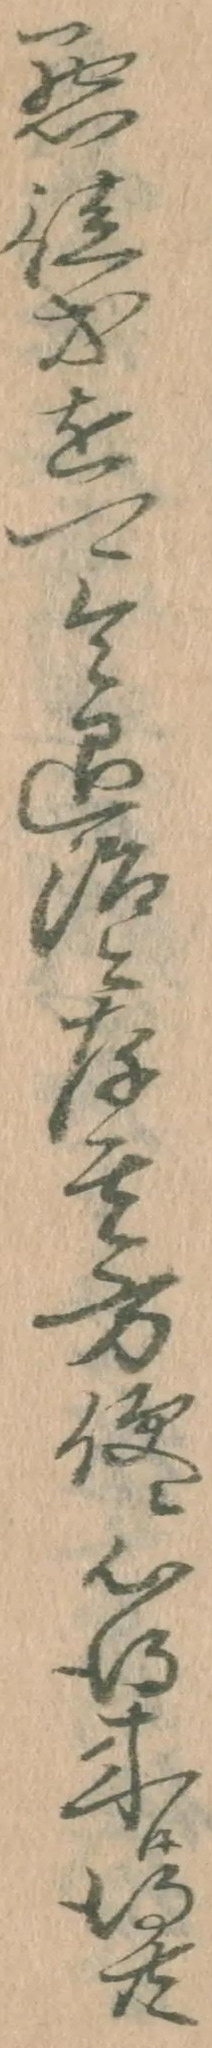悪徒等を可令退治と存其方便に心得来候得共
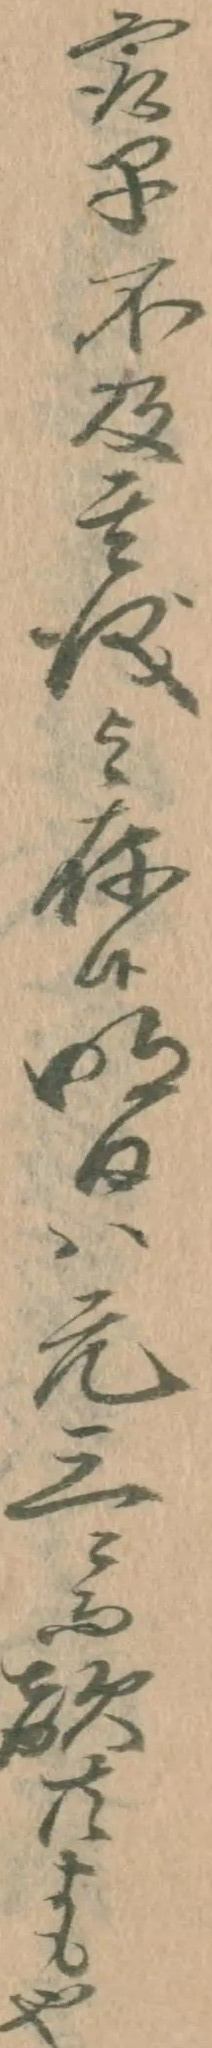最早不及其儀与存候明日は元三に而敵共よもや
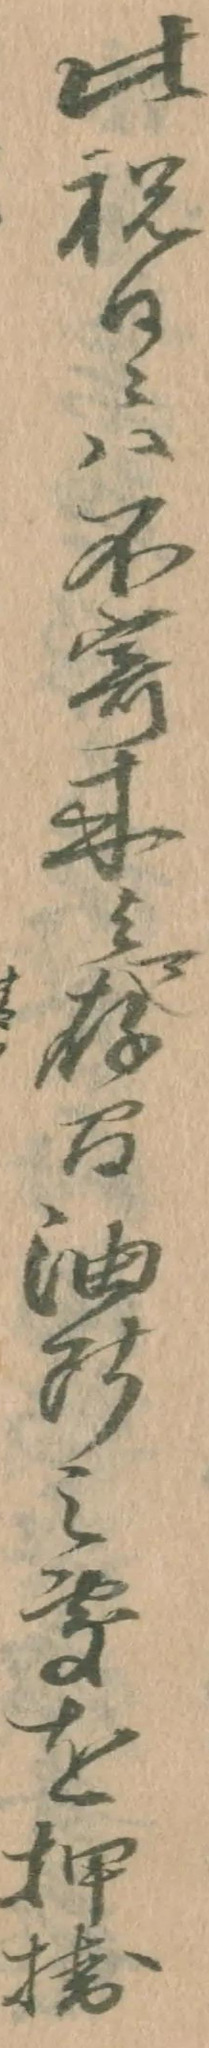此祝日には不寄来与可存間油断之處を押掛
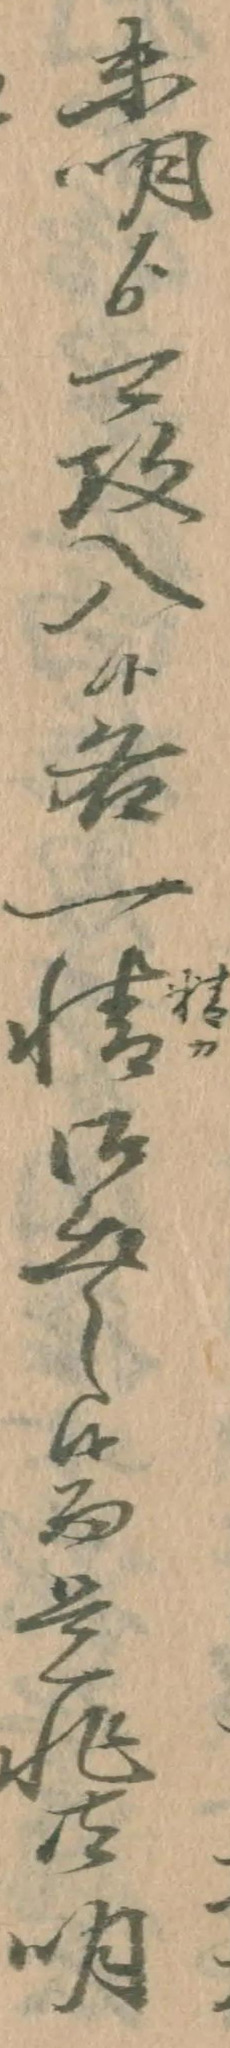未明ゟ可攻入候各一情御出し候而是非共明
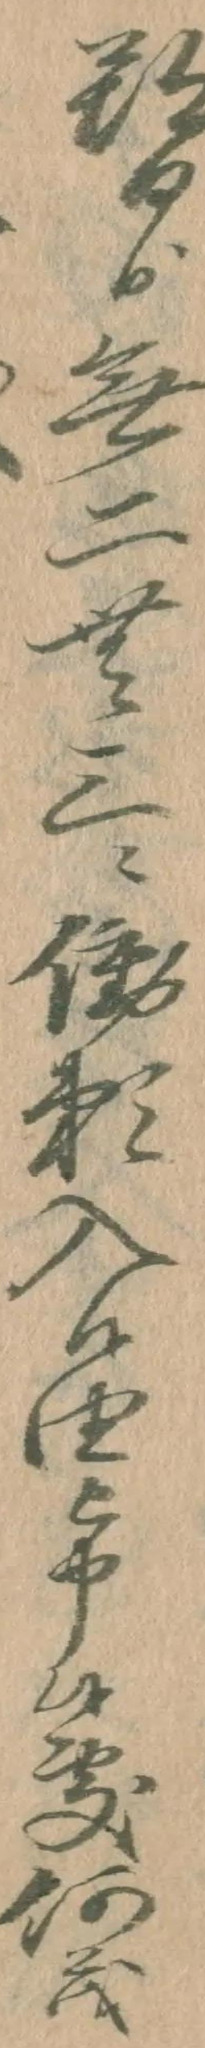朔日より無二無三に働頼入候由被申候處何茂
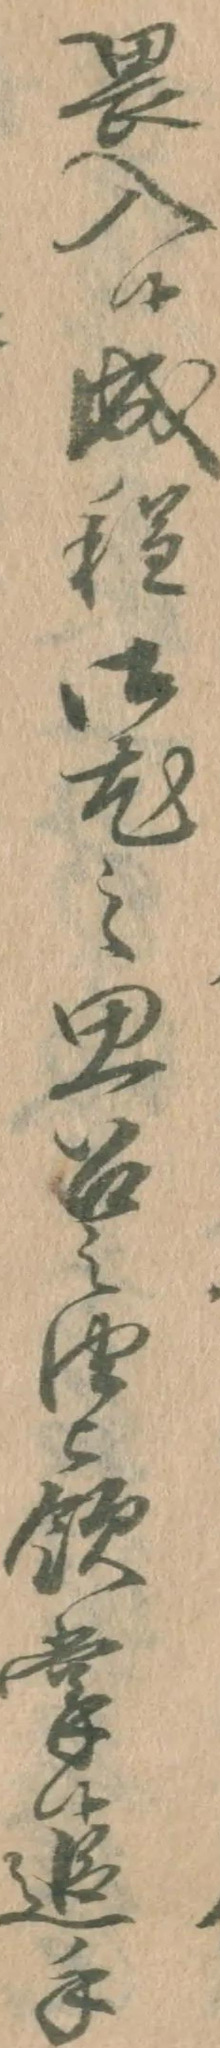畏入候成程御尤之思召之由被領掌候追手
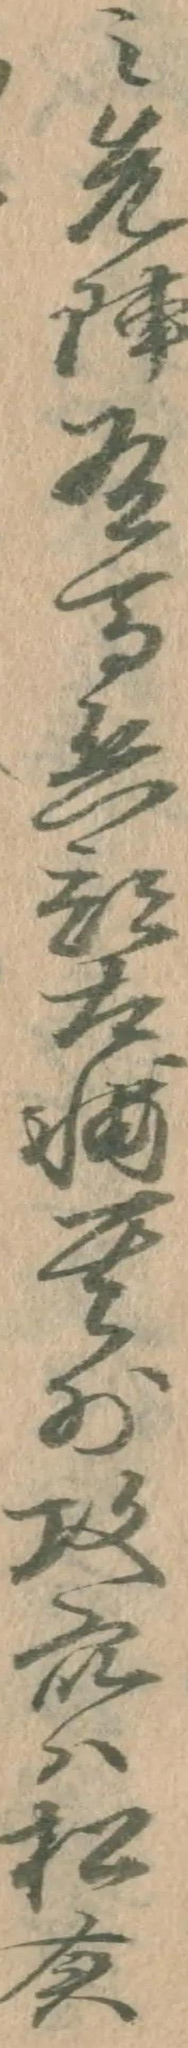之先陣有馬兵部太輔其外攻衆は松倉
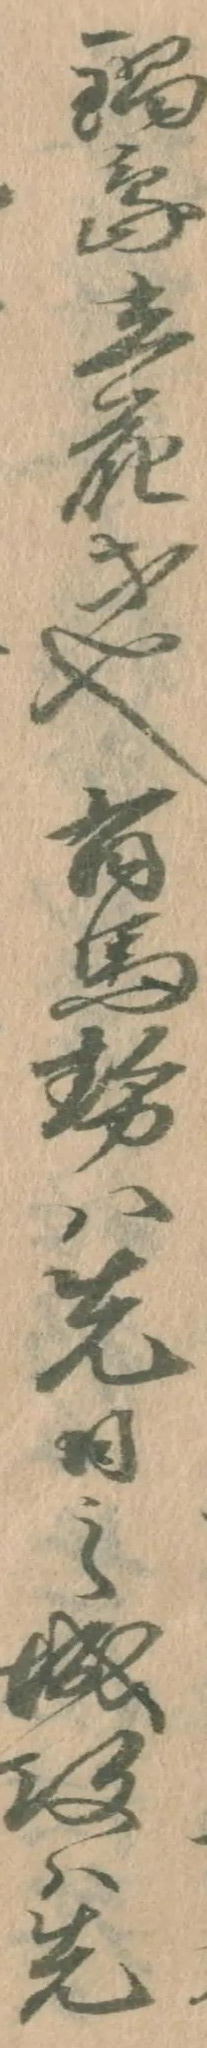鍋島立花等也有馬勢は先日之城攻は先
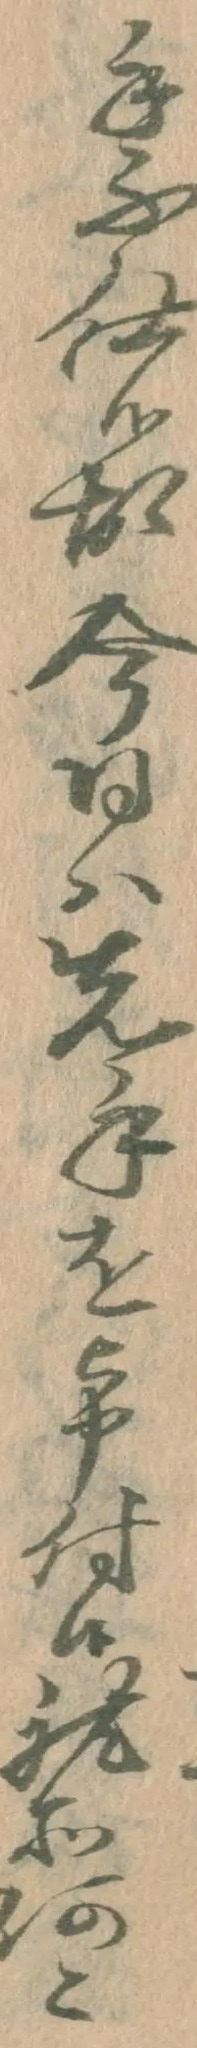手ふ仕候故今日は先手を被申付候然所何と
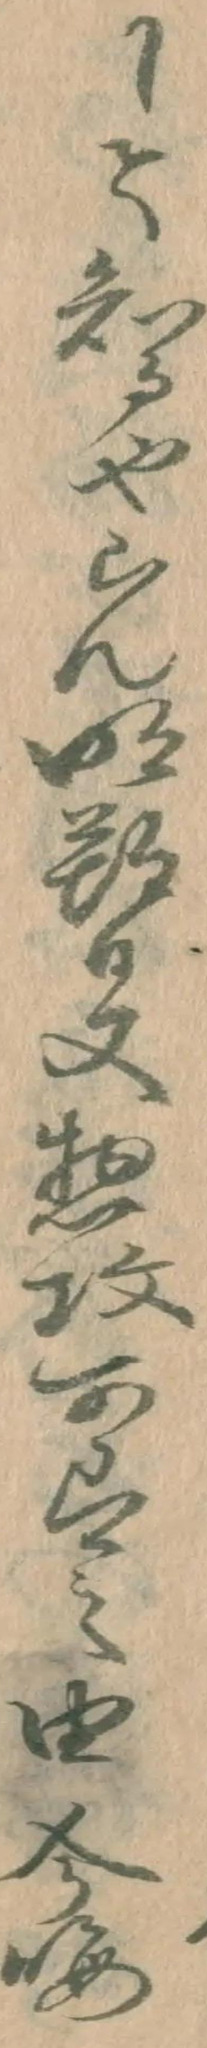して知るやらん明朔日又惣攻可望之由今晦
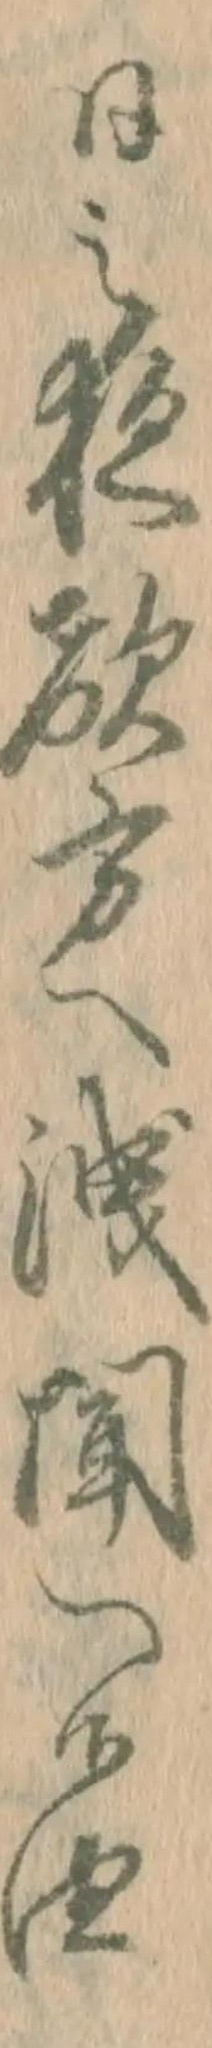日之夜敵方へ洩聞へ候由

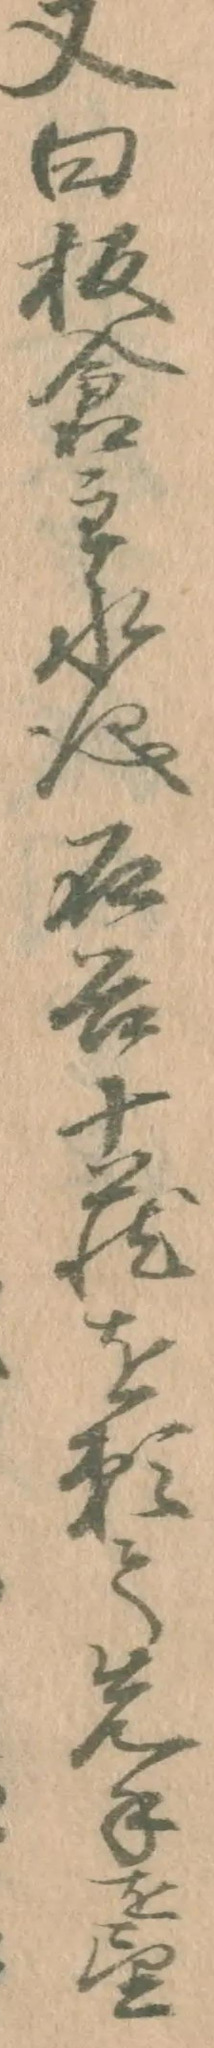又曰板倉主水儀石谷十蔵を頼て先手を望
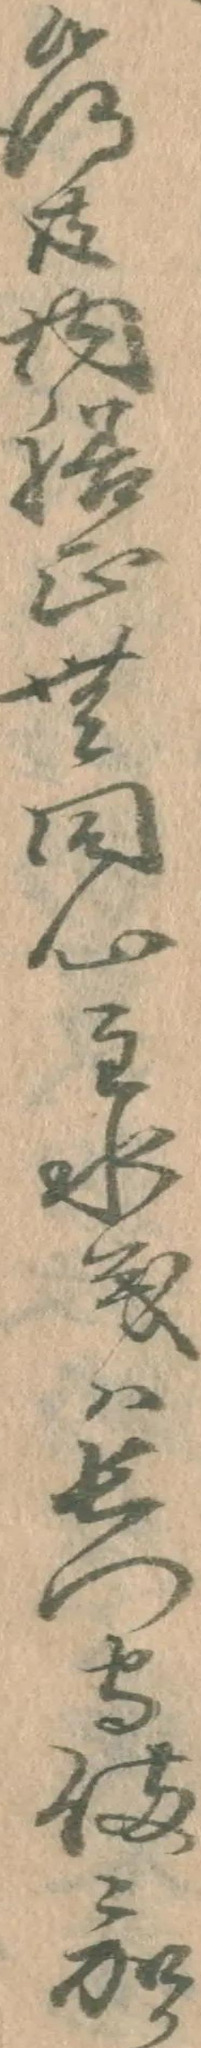候得共内膳正無同心主水義は長門守備に加り
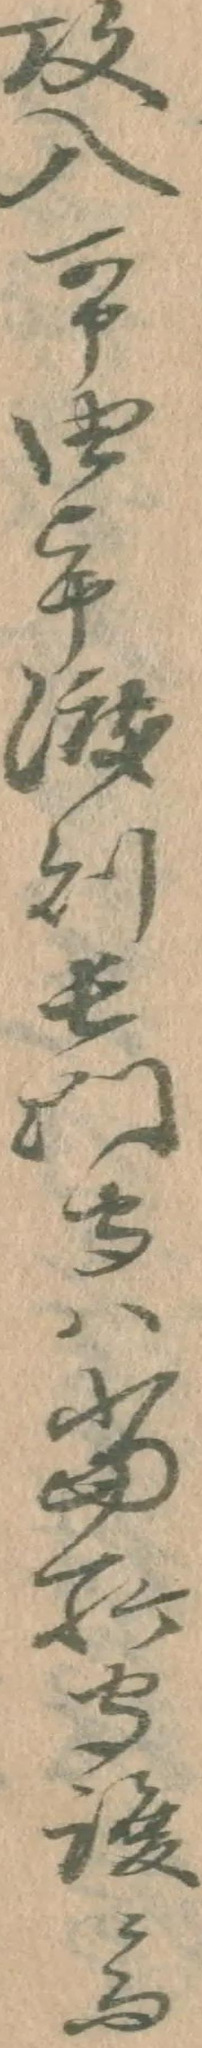攻入可申由被申渡則長門守は当所守護に而
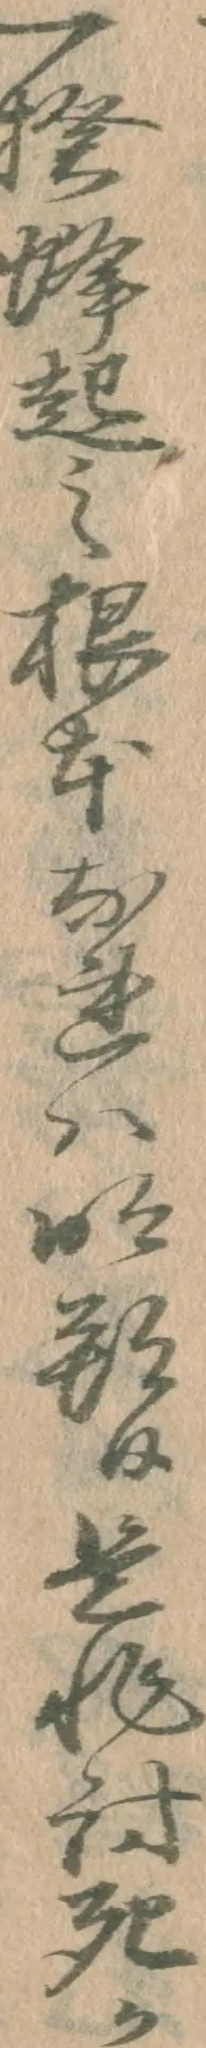一揆蜂起之根本な連は明朔日是非討死か
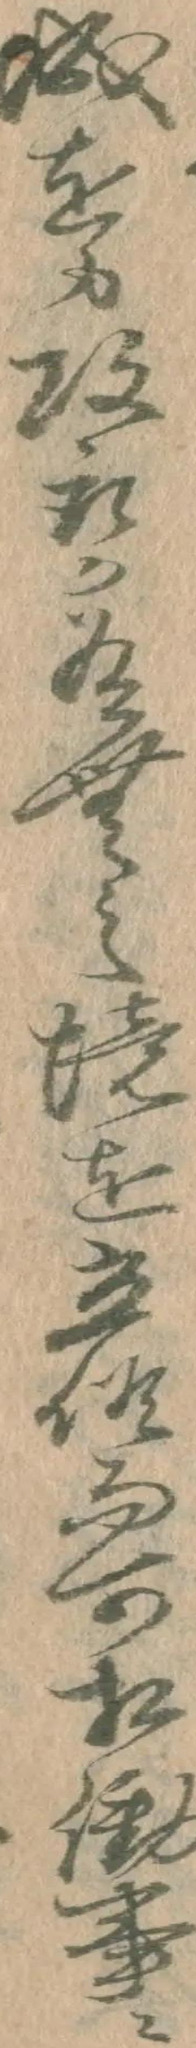城をも攻取か有無之境を立候而可相働事に
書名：切支丹御退治記 49巻. [5]
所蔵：国立国会図書館 National Diet Library, JAPAN
